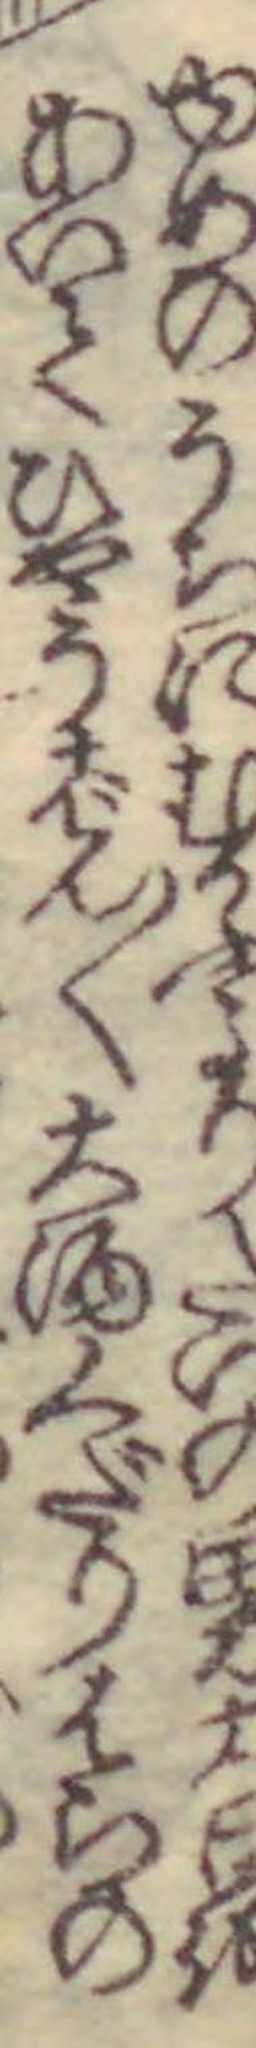あいてひやうばん〳〵大酒くだりはらの
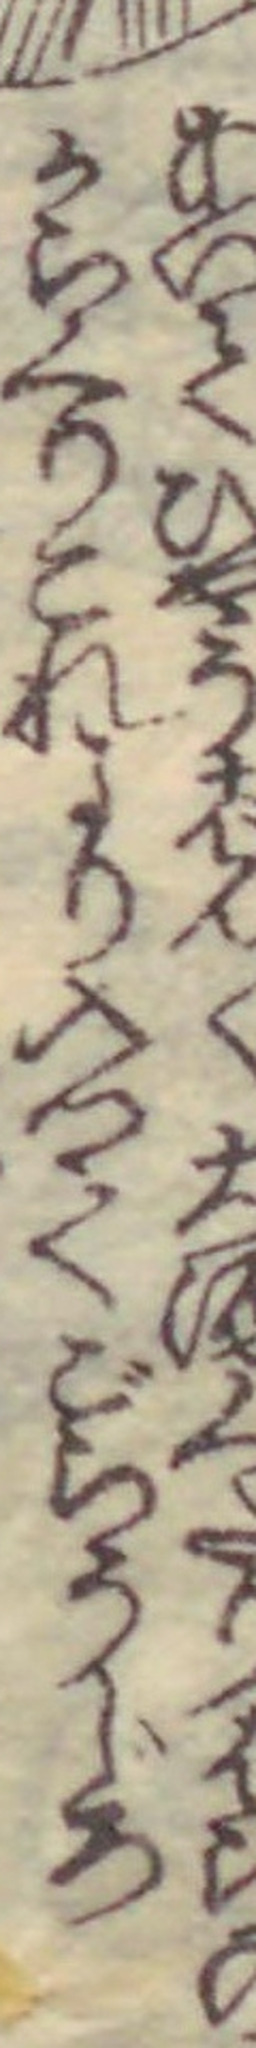からくりこれより入つてごらうじろ
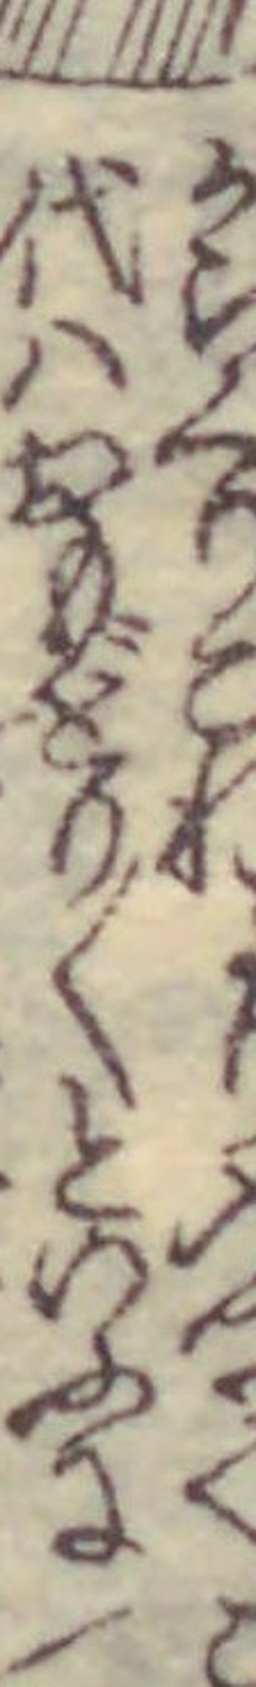代はおもどり〳〵といふに
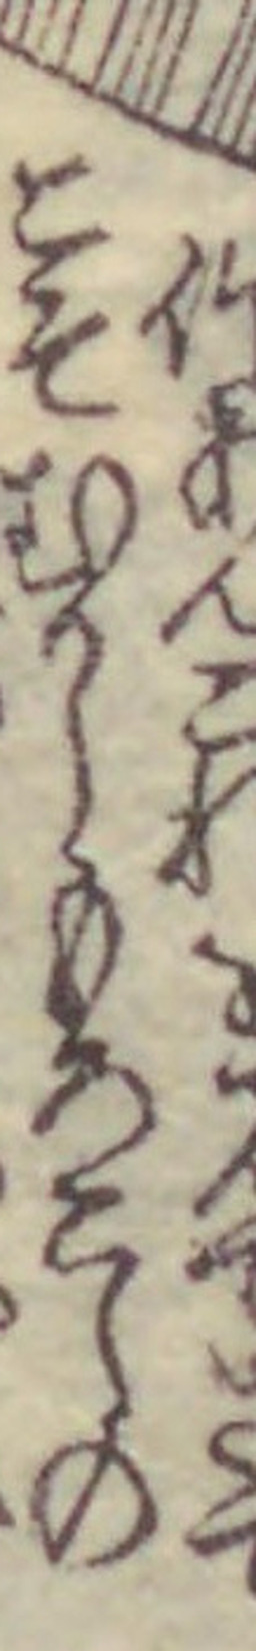こそむかしもろこしの
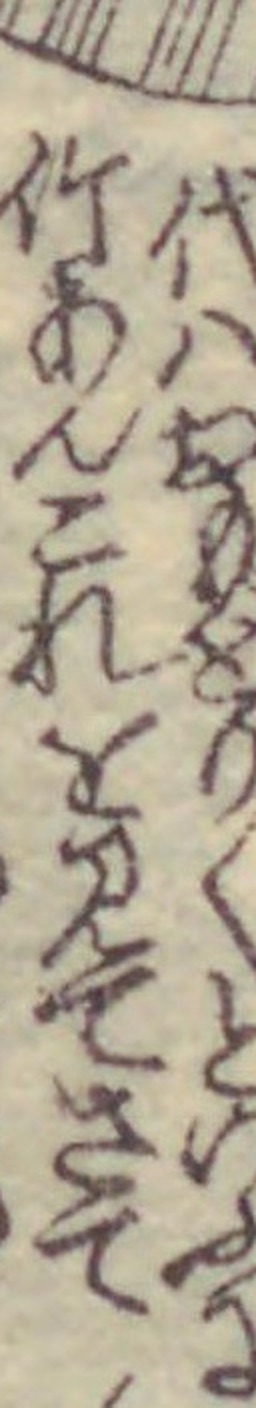竹あんこれを見てさて
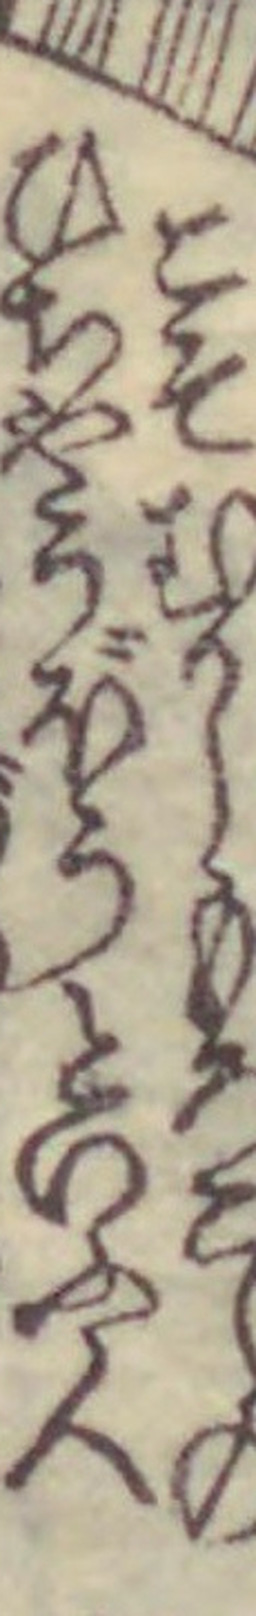ひちやうぼうといふ人
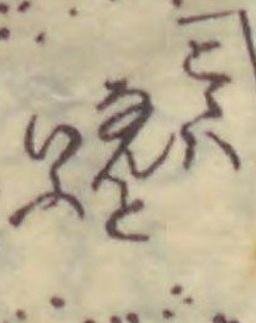なんと
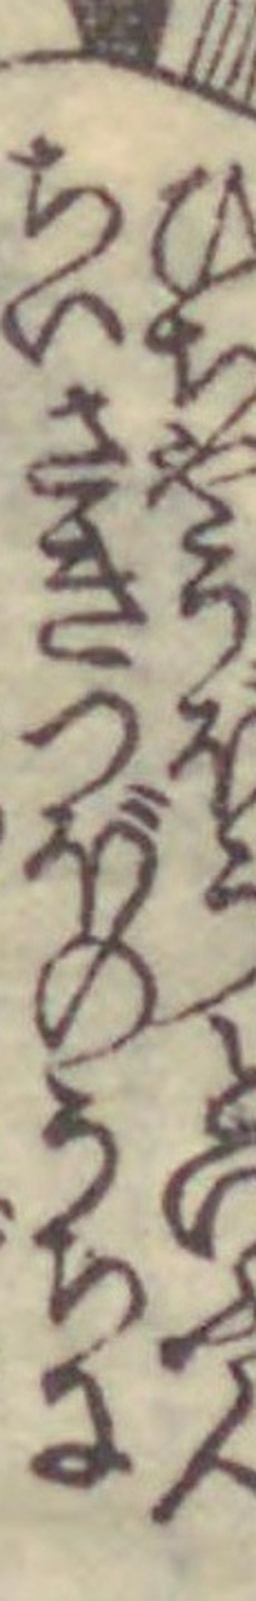ちいさきつぼのうちに
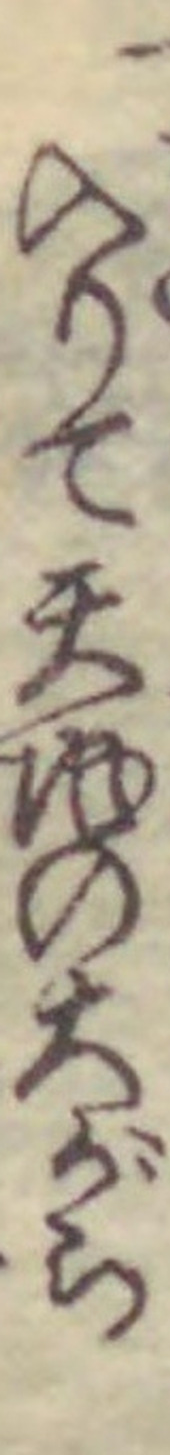入りて天地の大がら
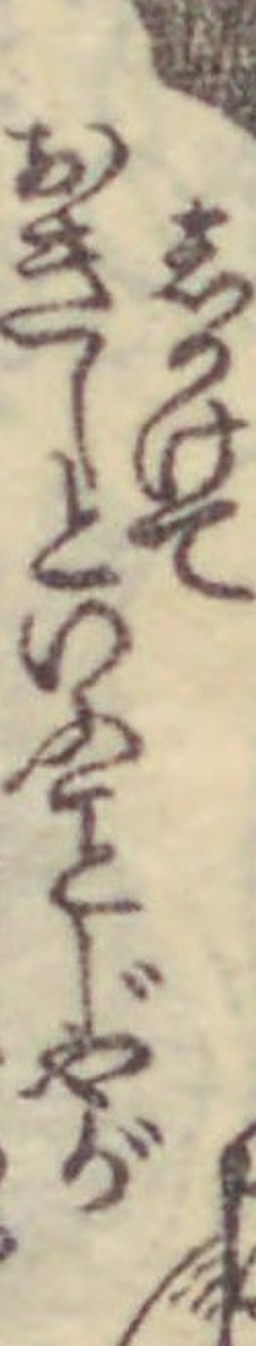おきしといふことじやが
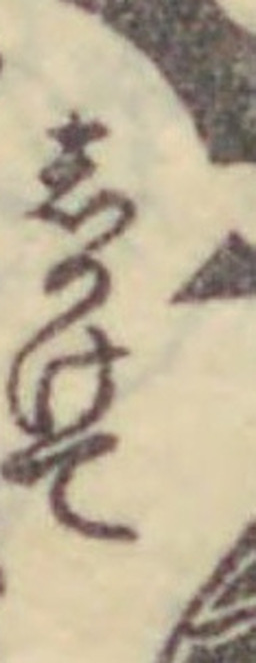しかけて
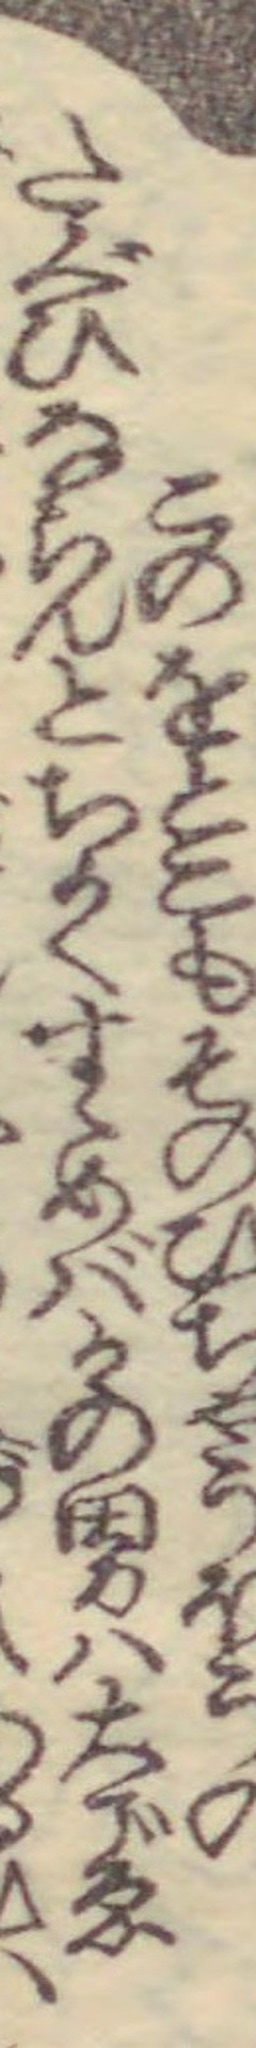たぐひならんとちかくすゝめばかの男は大ごゑ
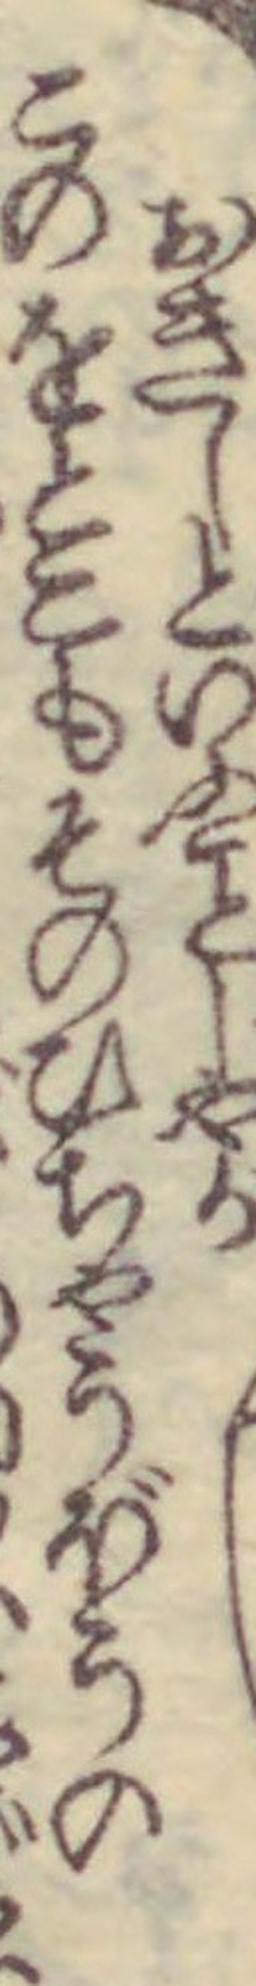このをとこもそのひちやうぼうの
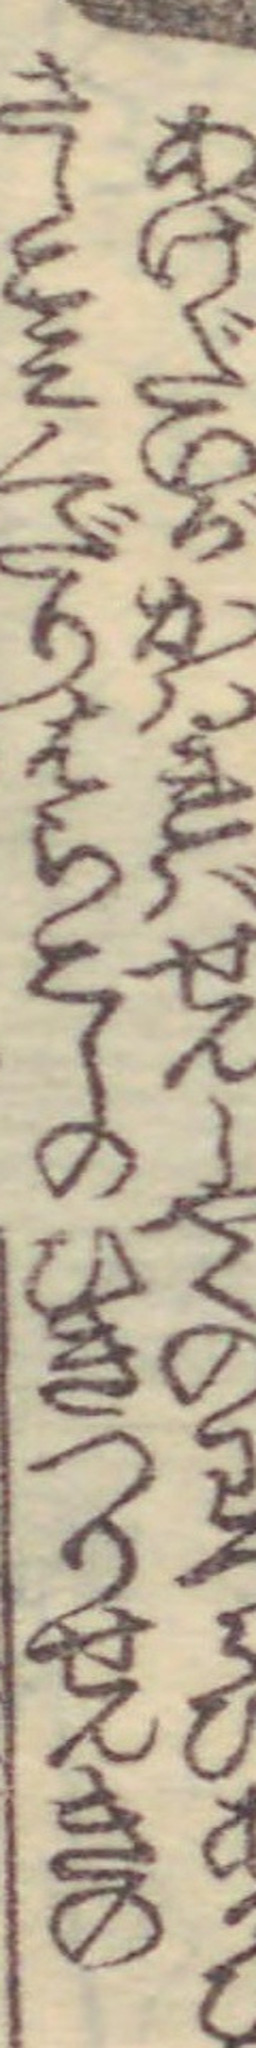さしこみくだりはらこしのひきつりせんきの
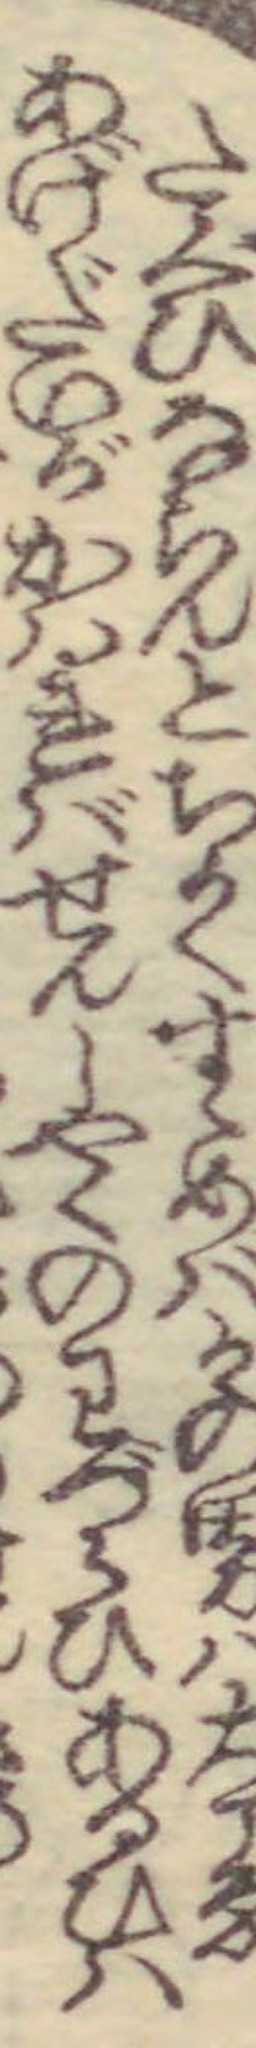あげだいがかはればせんしやくのわづらひあるひは
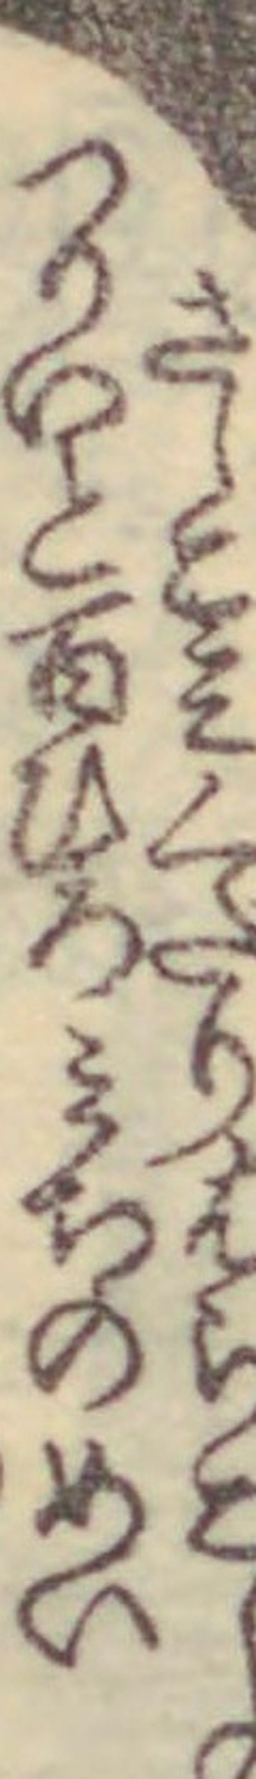つりいと百ひろみちのめい
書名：腹内窺機関 2巻
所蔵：国立国会図書館 National Diet Library, JAPAN
